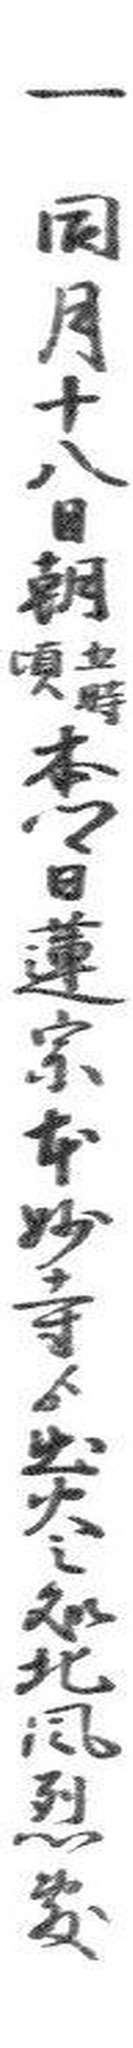一同月十八日朝五時頃本郷日蓮宗本妙寺ゟ出火之処北風烈敷
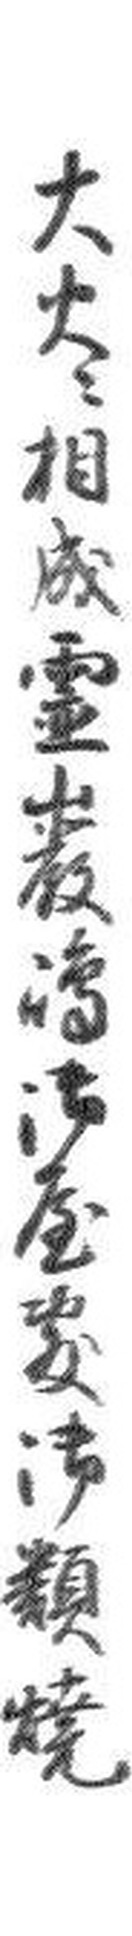大火ニ相成霊巌島御屋敷御類焼
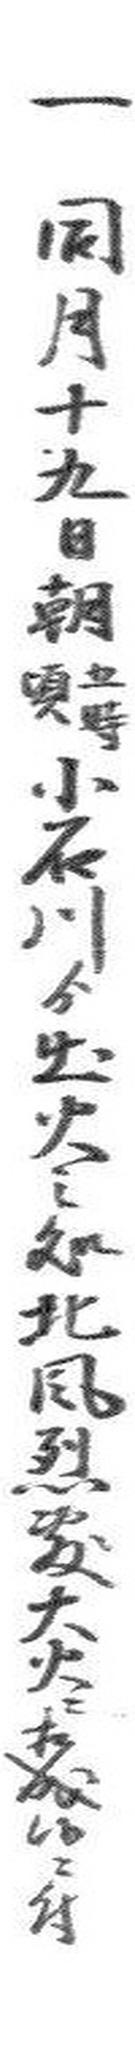一同月十九日朝五時頃小石川ゟ出火之処北風烈敷大火ニ相成候ニ
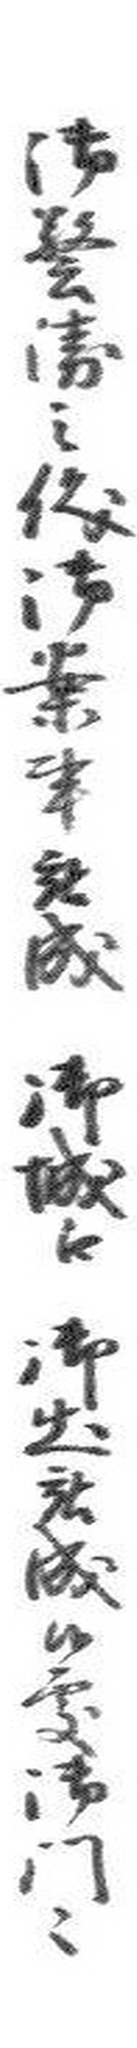御警衛之儀御案事被成御城江御出被成候処御門々
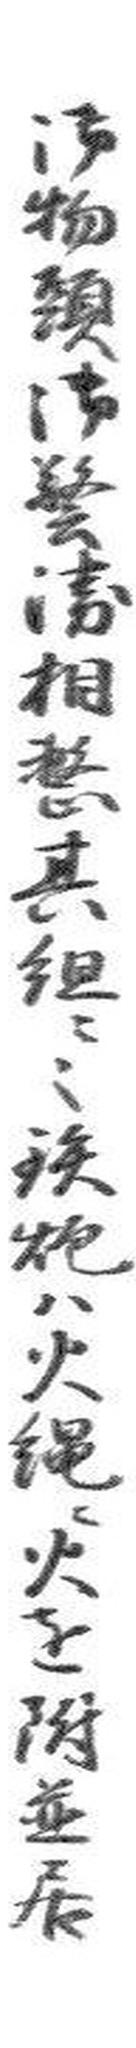御物頭御警衛相整其組々之鉄砲ハ火縄ニ火を附並居

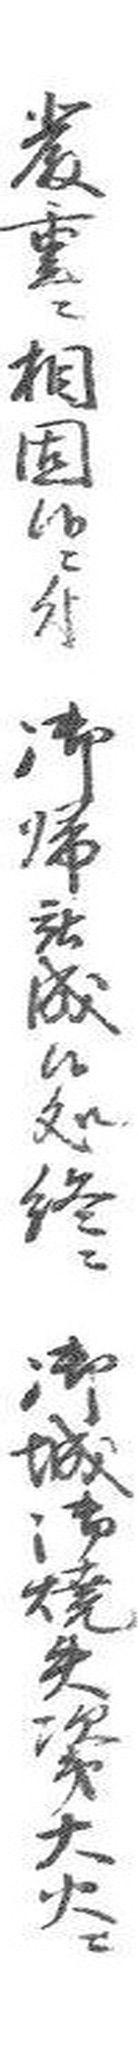厳重ニ相固候ニ付御帰被成候処終ニ御城御焼失次第大火
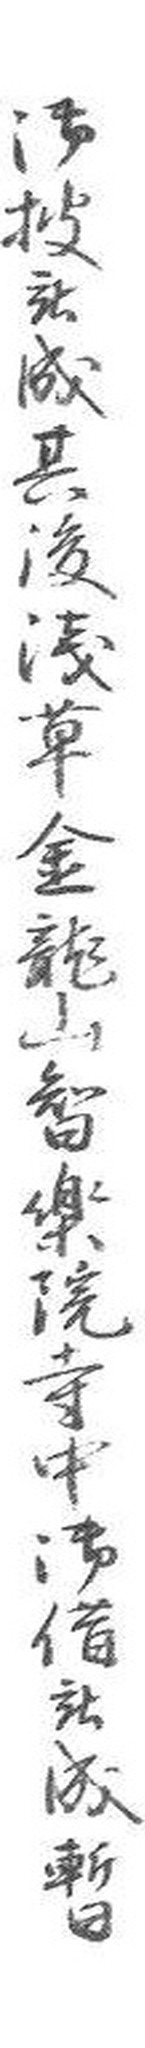御披被成其後浅草金龍山智楽院寺中御借被成暫
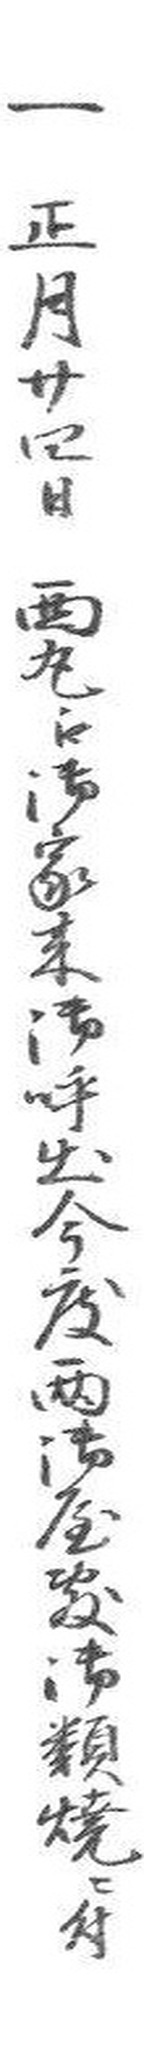一正月廿四日西丸江御家来御呼出今度両御屋敷御類焼ニ付
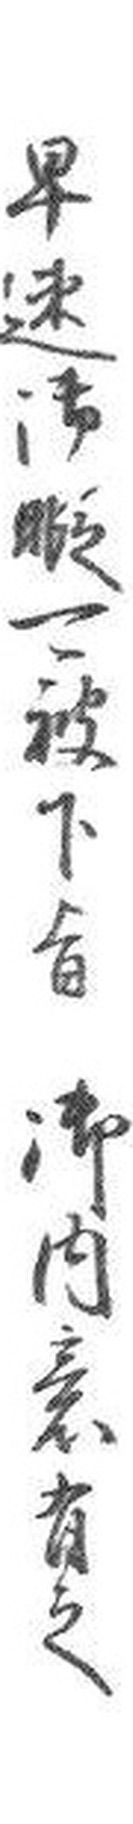早速御暇可被下旨御内意有之
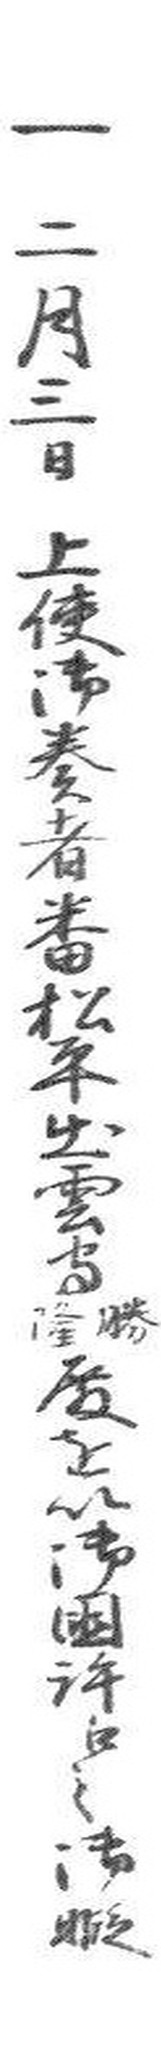一二月三日上使御奏者番松平出雲守勝隆殿を以御国許江之御暇
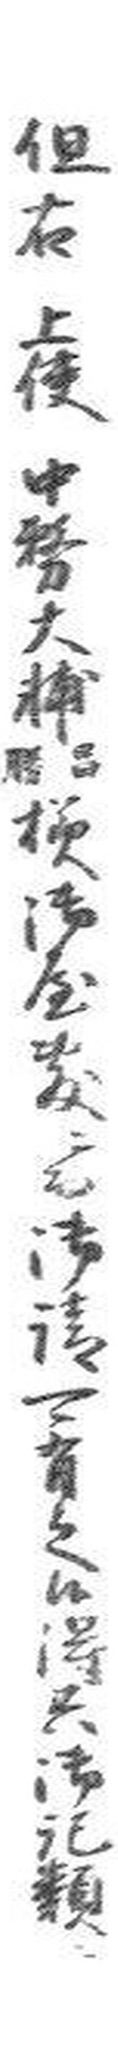但右上使中務大輔昌勝様御屋敷ニ而御請可有之候得共
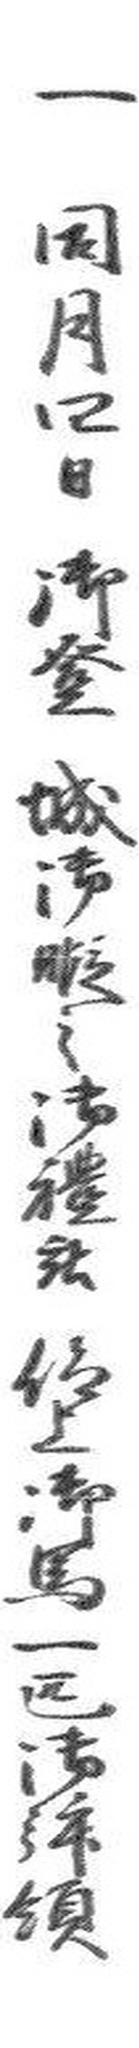一同月四日御登城御暇之御礼被仰上御馬一匹御拝領
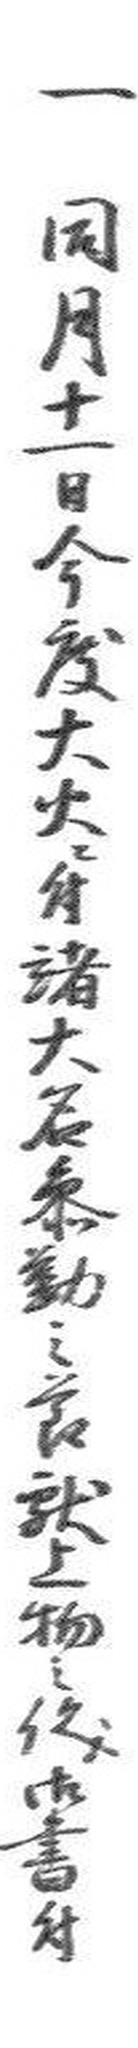一同月十一日今度大火ニ付諸大名参勤之節献上物之儀御書付
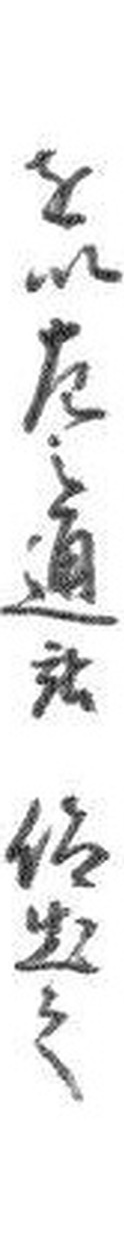を以左之通被仰出之
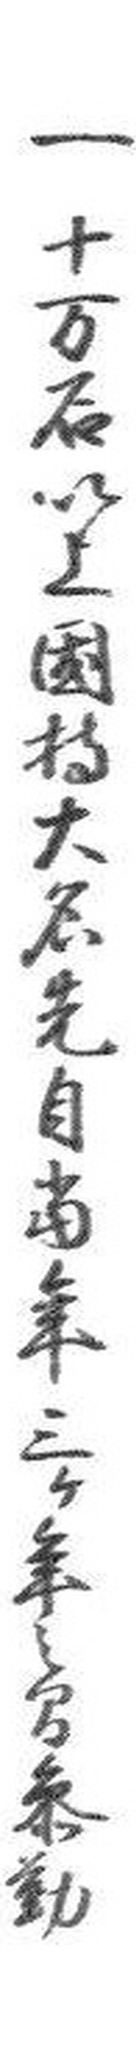一十万石以上国持大名先自当年三ヵ年之間参勤
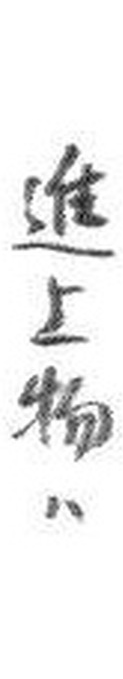進上物ハ
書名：家譜 五 光通公 従寛永十三年到万治二年
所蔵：福井県文書館 Fukui Prefectural Archives
